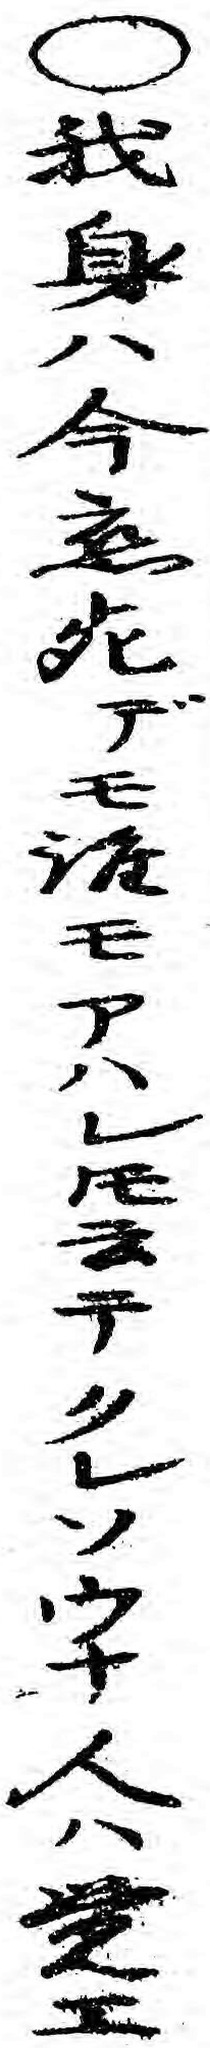○我身ハ今恋死デモ誰モアハレトモ云テクレソウナ人ハ覚エ
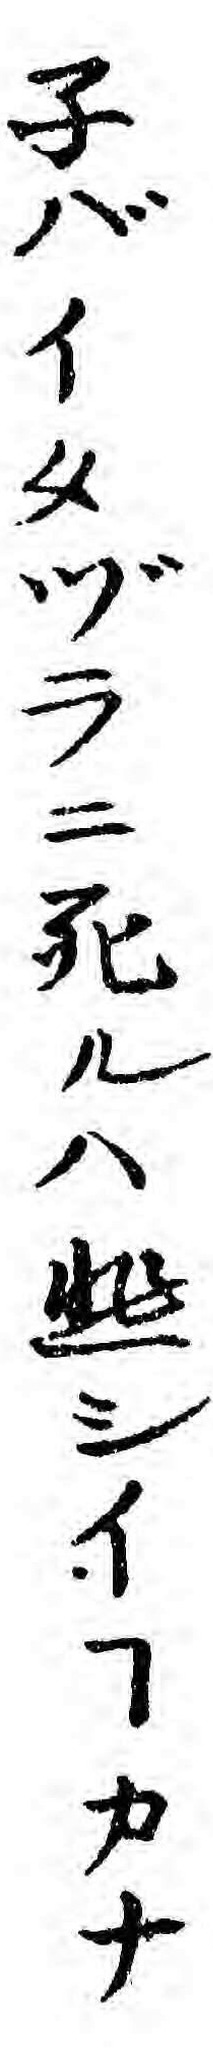ネバイタヅラニ死ルハ悲シイコトカナ
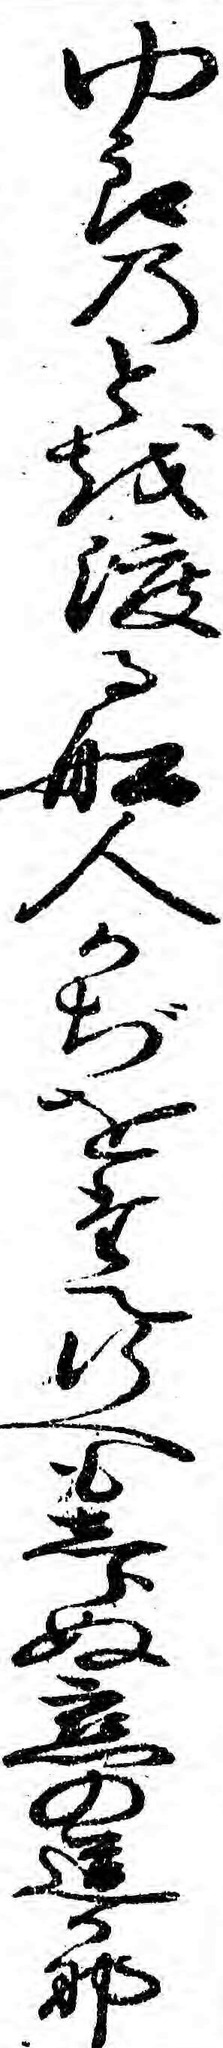ゆらのとを渡る船人かぢをたえ行へもしらぬ恋の道かな
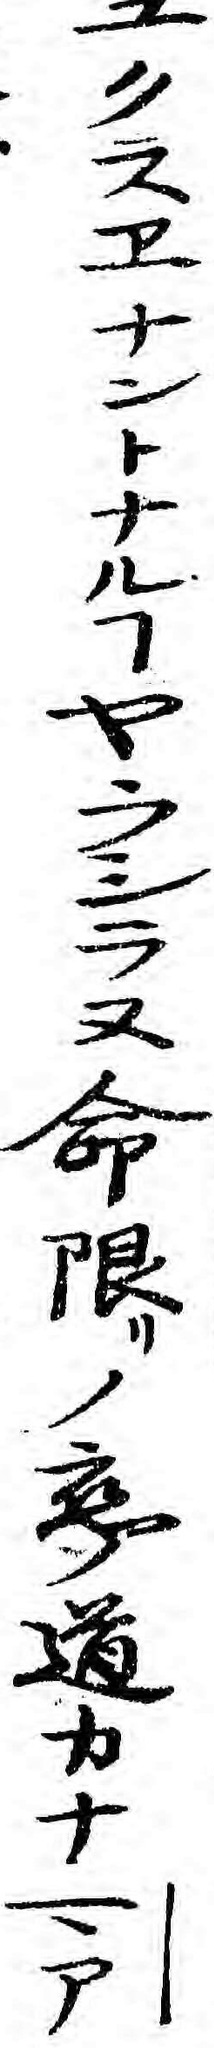○上ユクスヱナントナルコトヤラシラヌ命限ノ恋ノ道カナマア
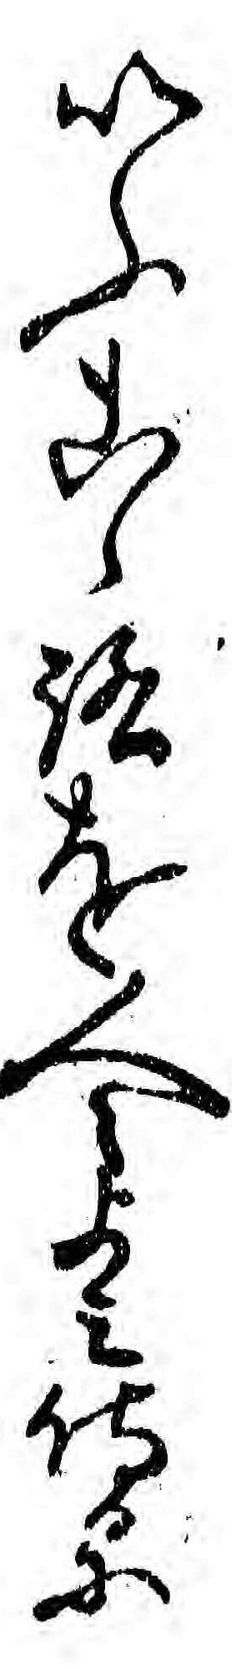いふこゝろを人々よみ侍るに
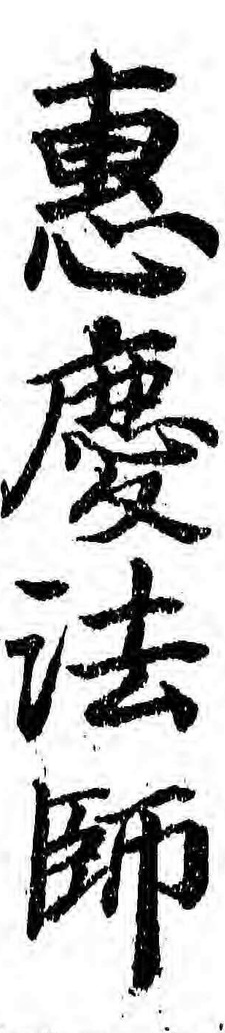恵慶法師
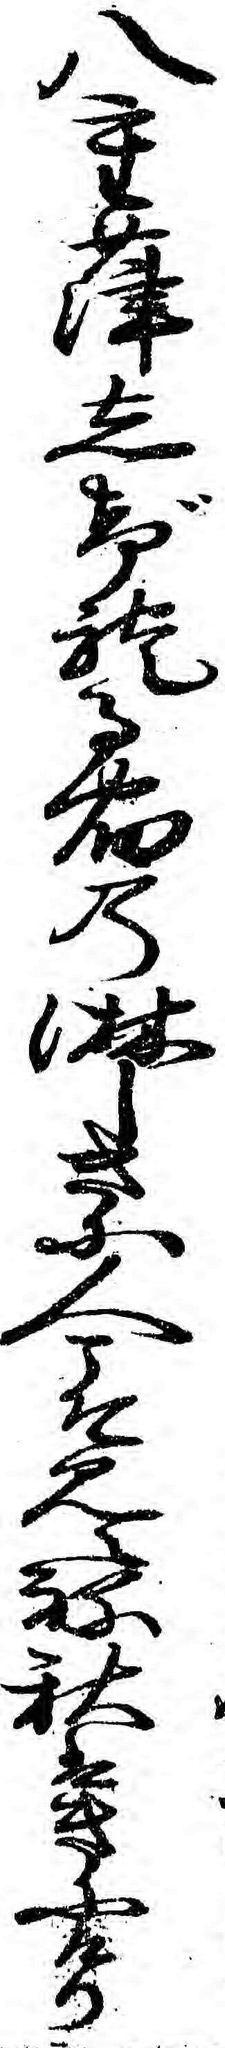八重葎しげれる宿の淋しきに人こそ見えね秋はきにけり
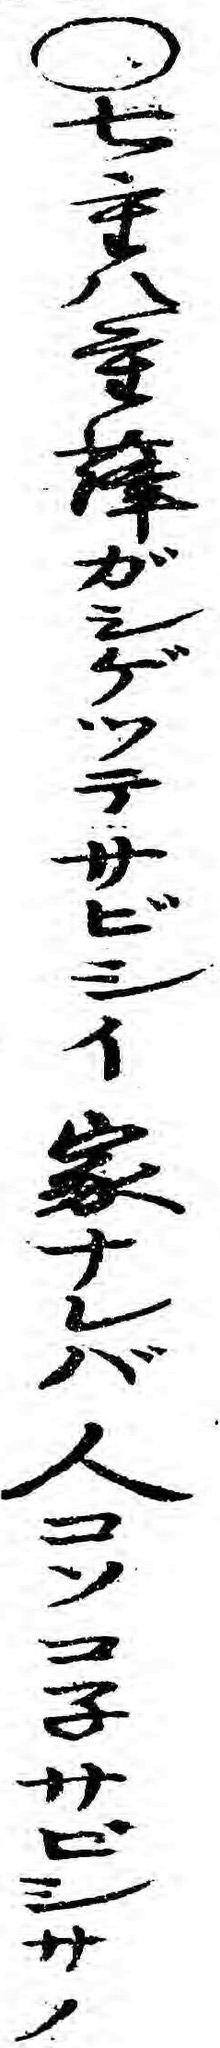○七重八重葎ガシゲツテサビシイ家ナレバ人コソコネサビシサノ
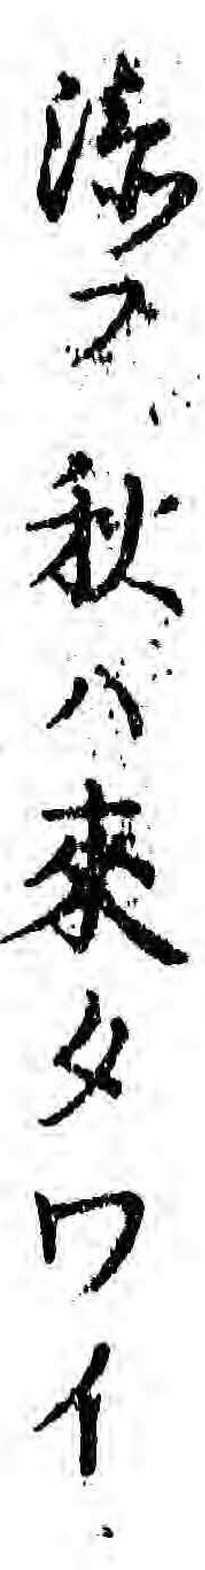添フ秋ハ来タワイ
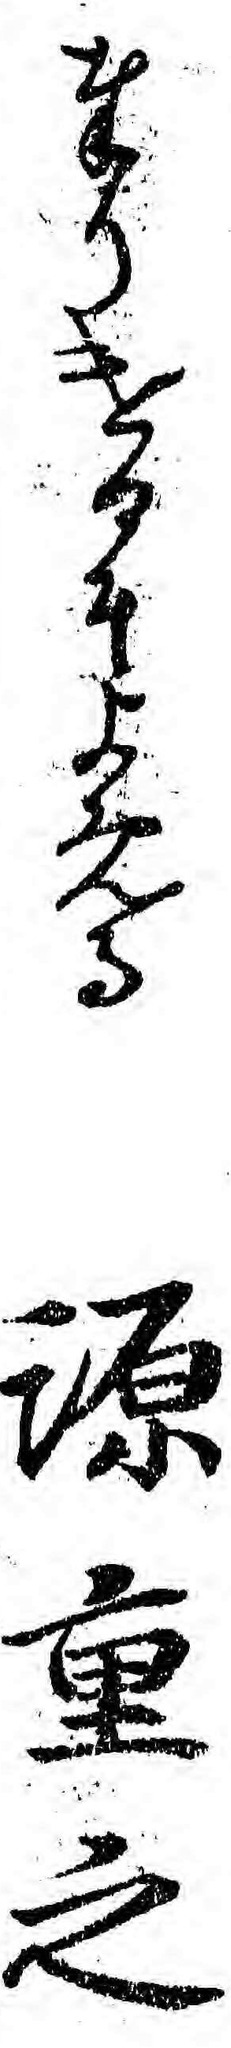奉りけるによめる源重之

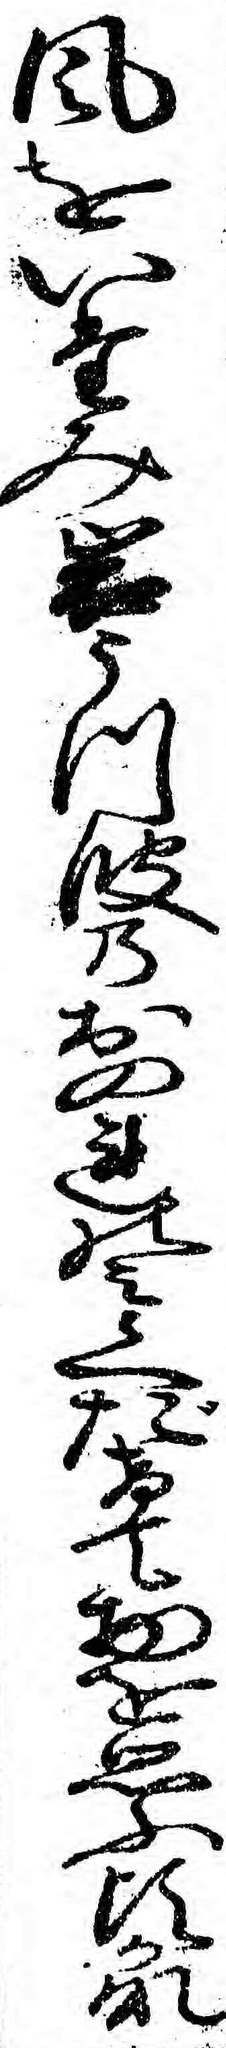風をいたみ岩うつ波のおのれのみくだけて物を思ふ頃かな
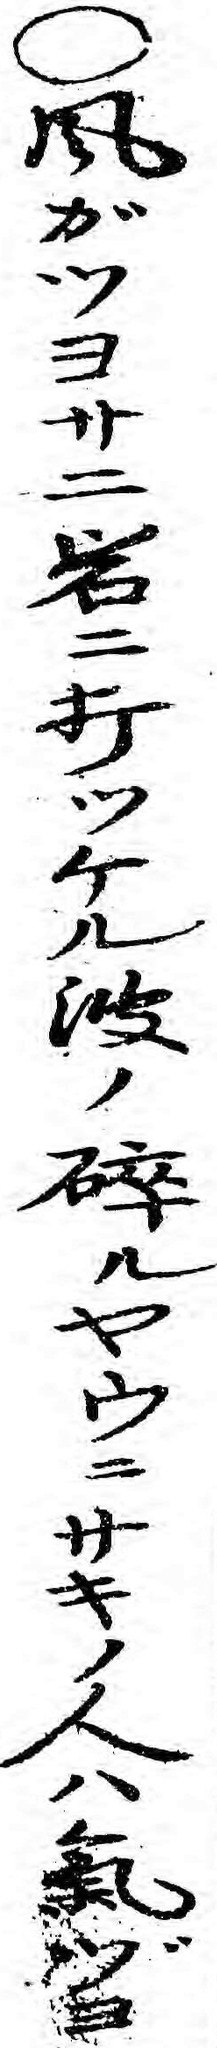○風ガツヨサニ岩ニ打ツケル波ノ砕ルヤウニサキノ人ハ気ヅヨ
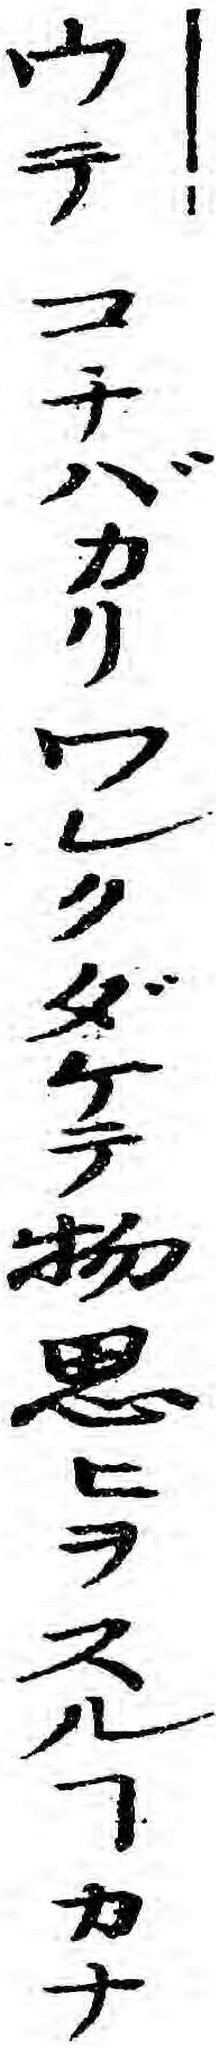ウテコチバカリワレクダケテ物思ヒヲスルコトカナ
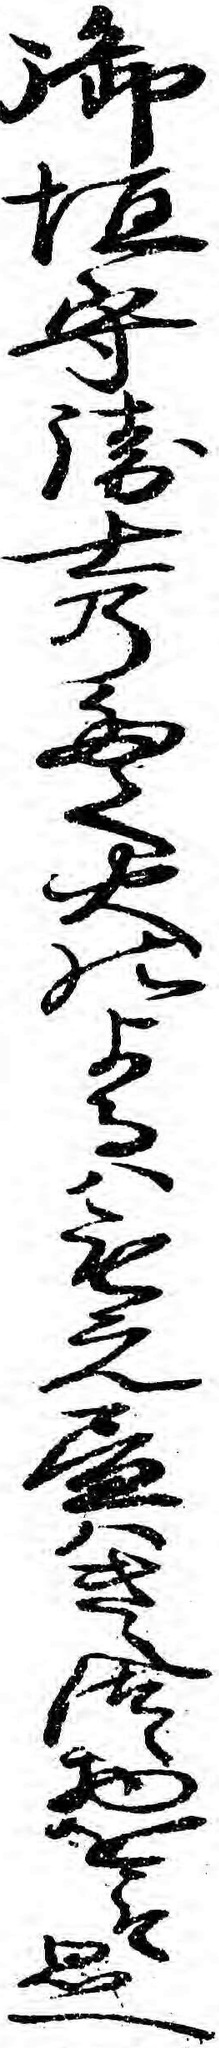御垣守衛士のたく火のよるはもえ昼はきえつゝ物をこそ思へ
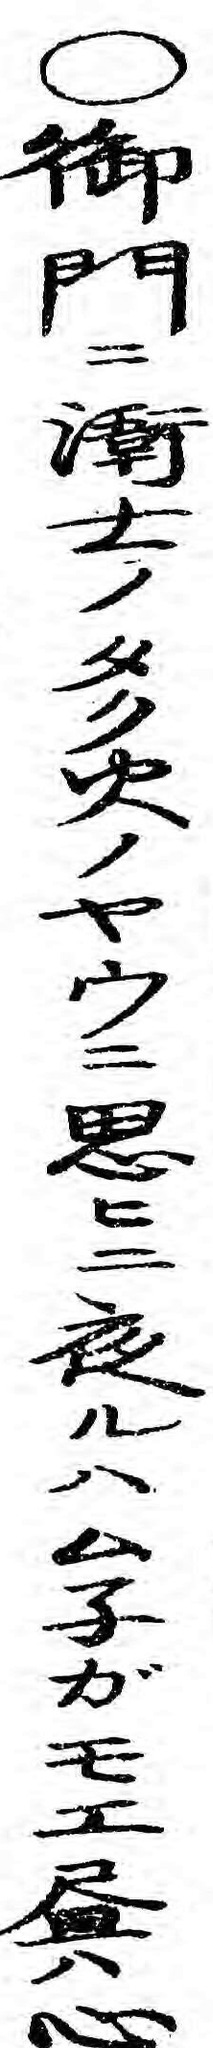○御門ニ衛士ノタク火ノヤウニ思ヒニ夜ルハムネガモエ昼ハ心
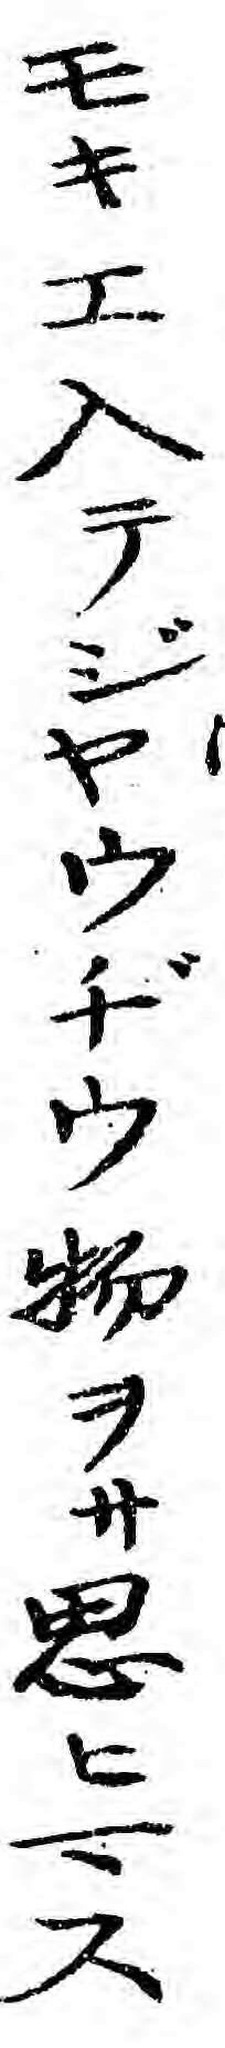モキエ入テジヤウヂウ物ヲサ思ヒマス
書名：百人一首／小倉の山ふみ
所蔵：国文学研究資料館
